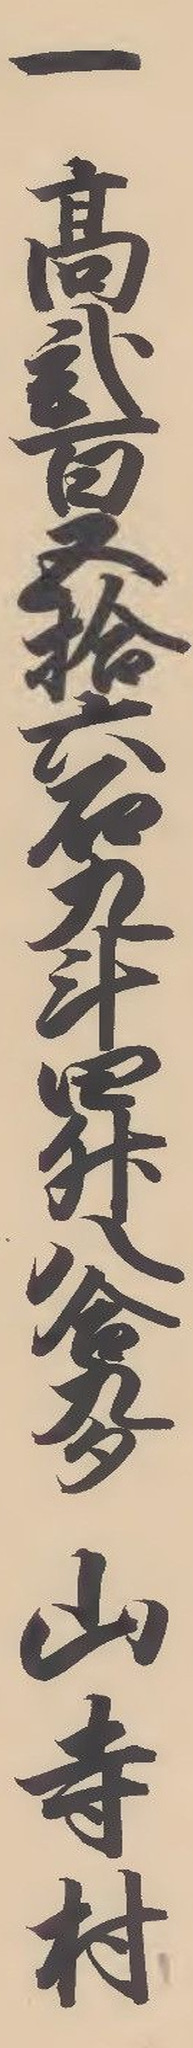一高弐百五拾六石九斗四升八合九勺山寺村

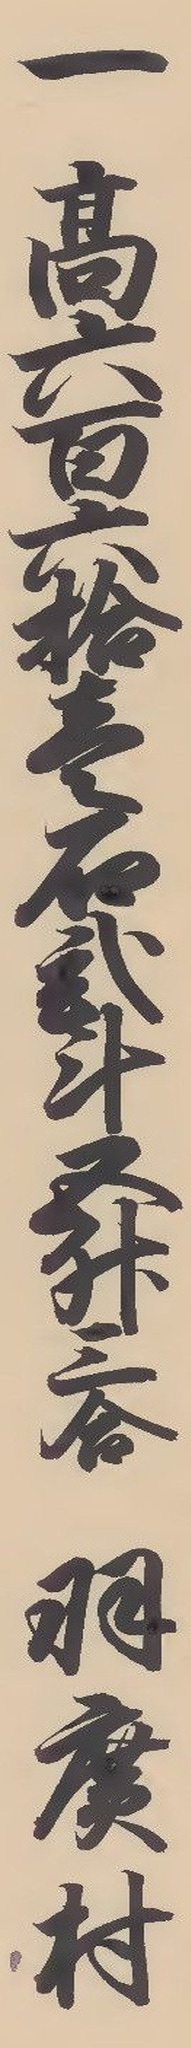一高六百六拾壱石弐斗五升三合羽広村
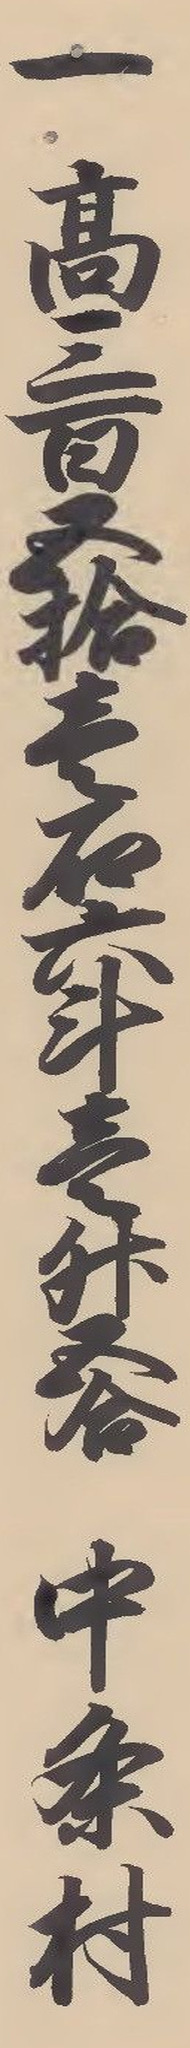一高三百五拾壱石六斗壱升五合中条村
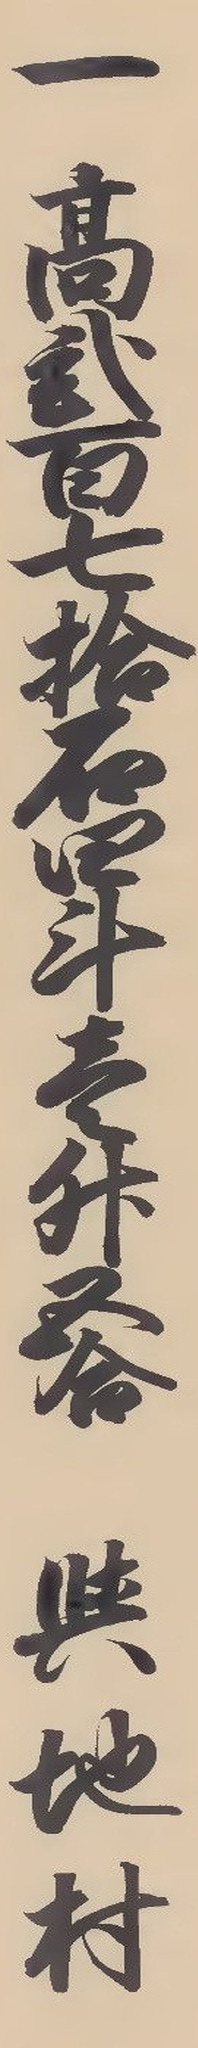一高弐百七拾石四斗壱升五合与地村
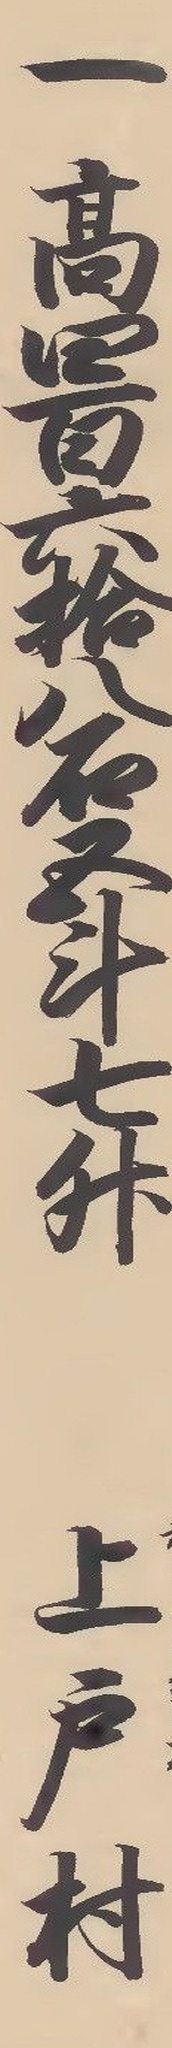一高四百六拾八石五斗七升上戸村
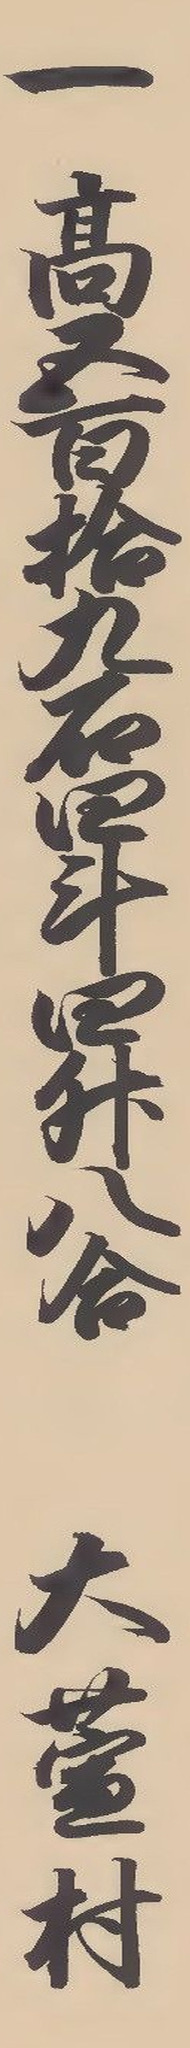一高五百拾九石四斗四升八合大萱村
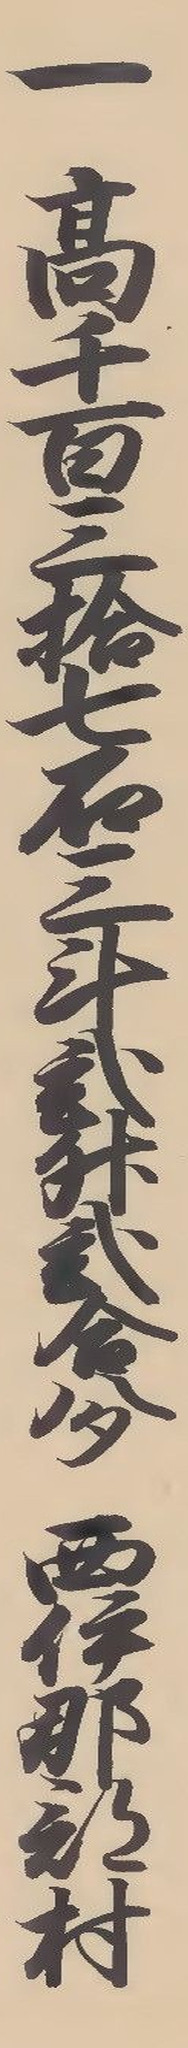一高千百三拾七石三斗弐升弐合八勺西伊那部村
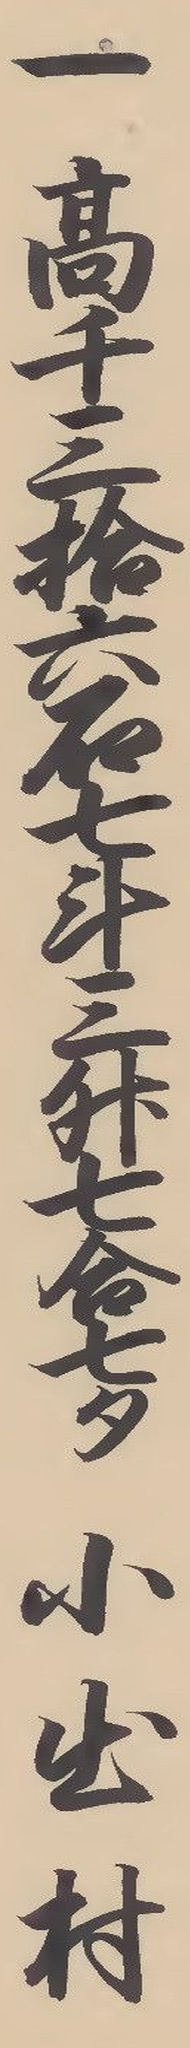一高千三拾六石七斗三升七合七勺小出村
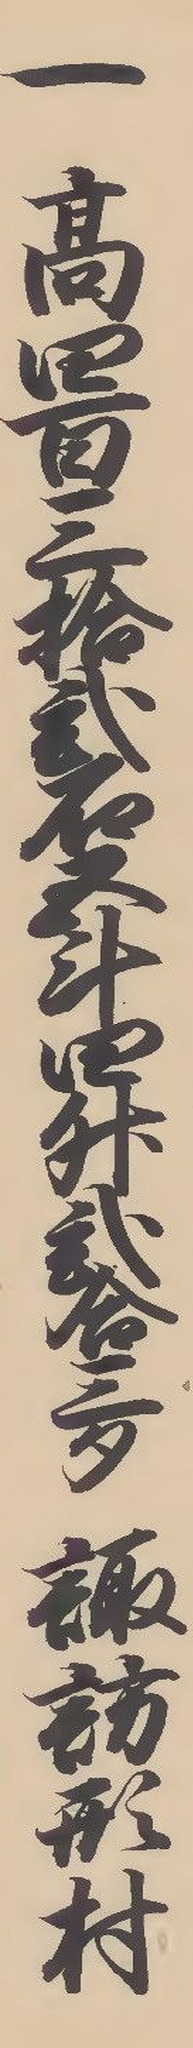一高四百三拾弐石五斗四升弐合三勺諏訪形村

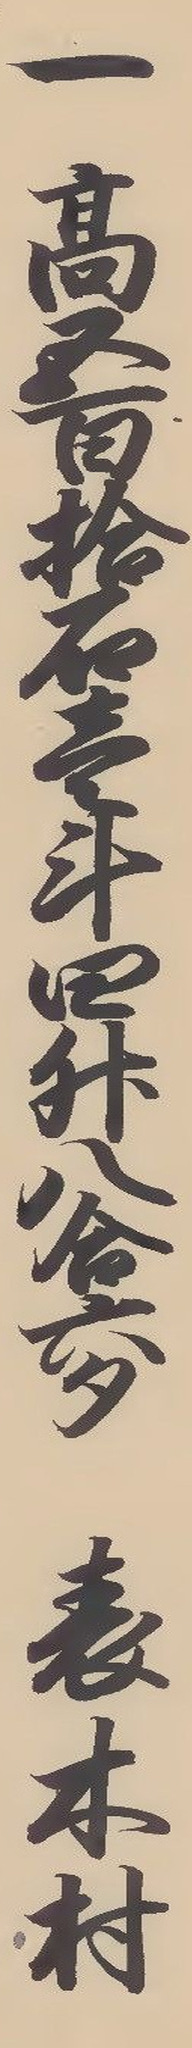一高五百拾石壱斗四升八合六勺表木村
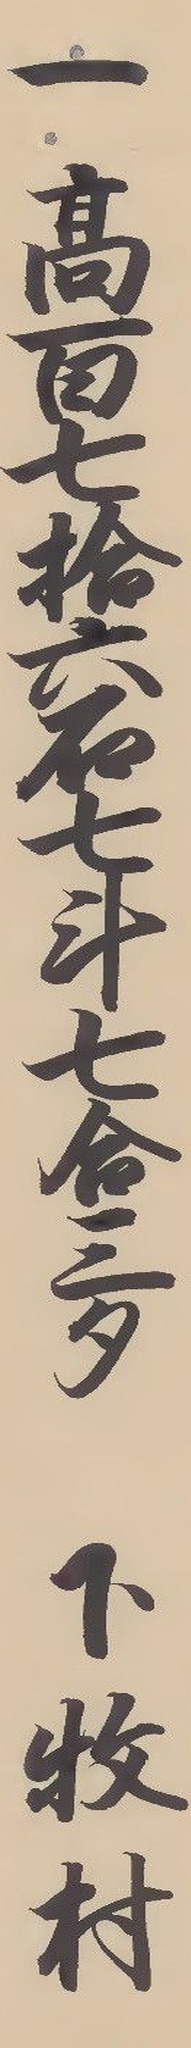一高百七拾六石七斗七合三勺下牧村
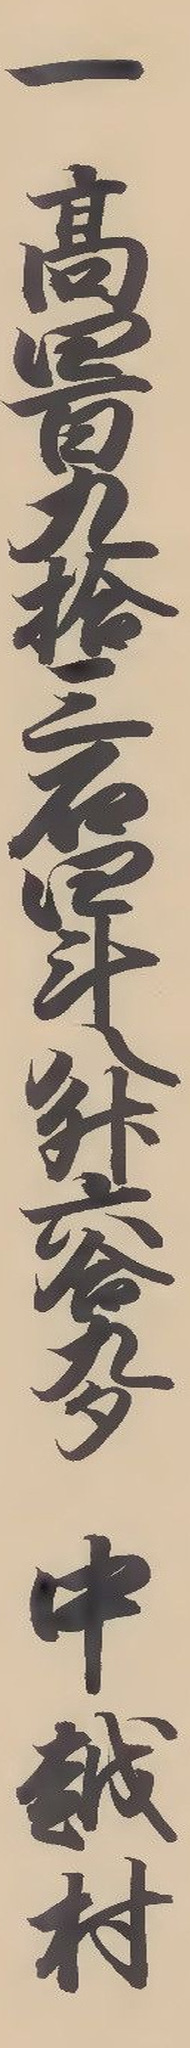一高四百九拾三石四斗八升六合九勺中越村
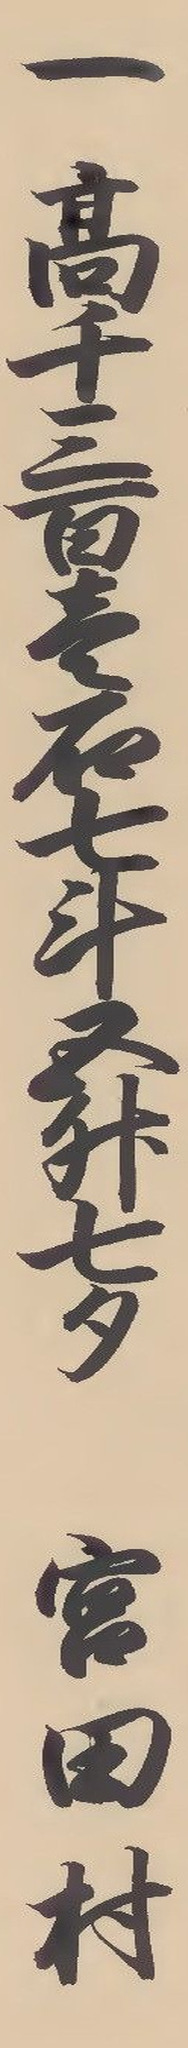一高千三百壱石七斗五升七勺宮田村
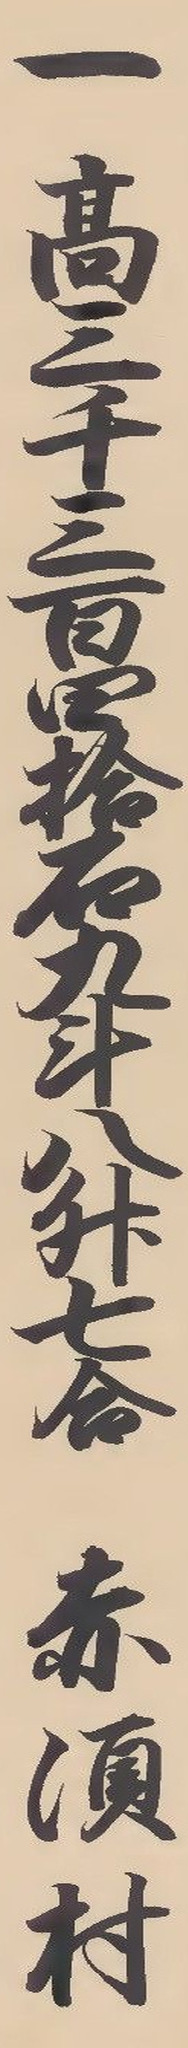一高三千三百四拾石九斗八升七合赤須村
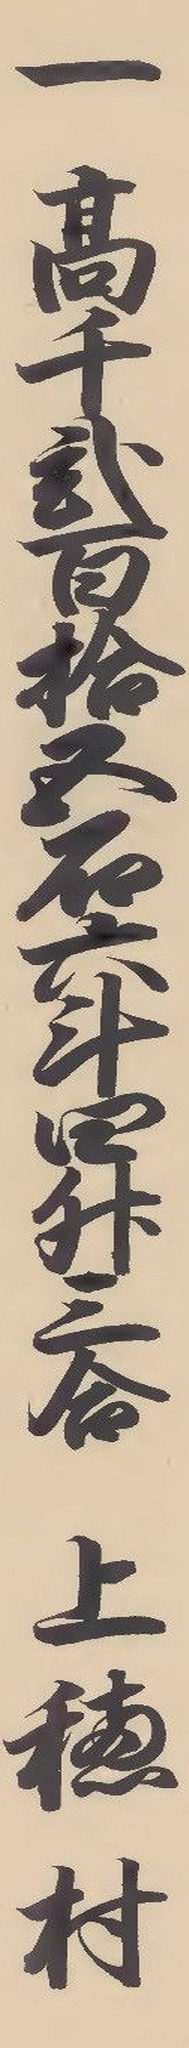一高千弐百拾五石六斗四升三合上穂村
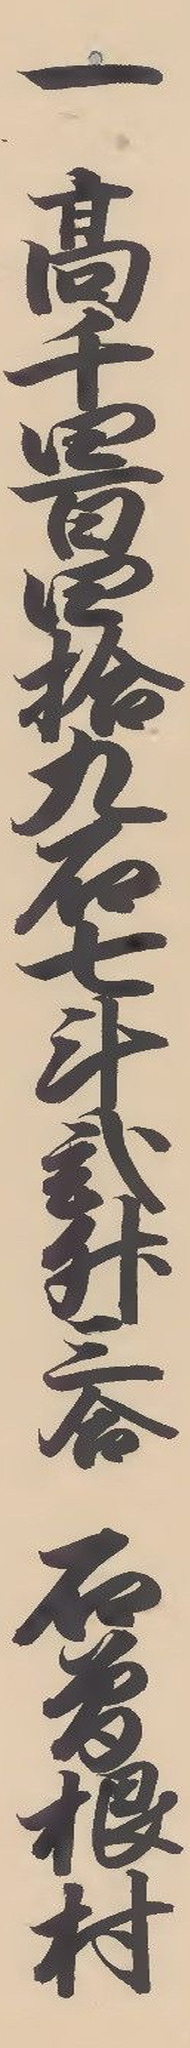一高千四百四拾九石七斗弐升三合石曽根村
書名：信濃国郷帳
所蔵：国立公文書館 National Archives of Japan
